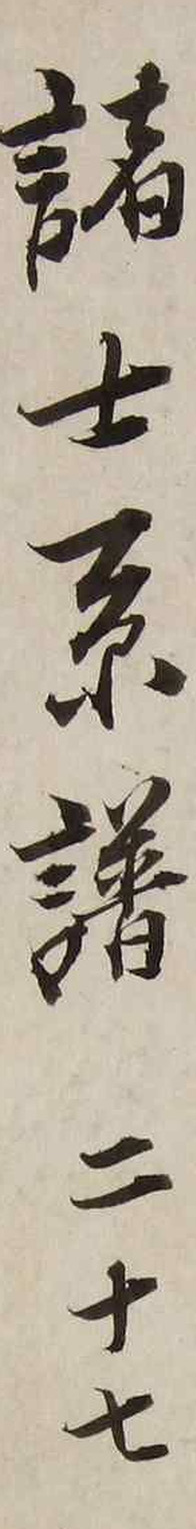諸士系譜二十七

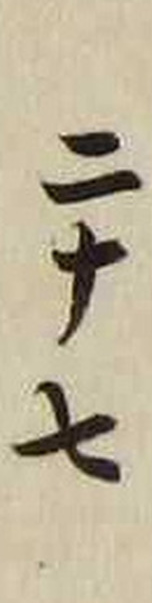二十七
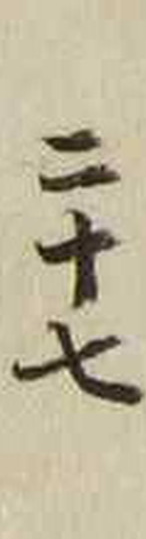二十七

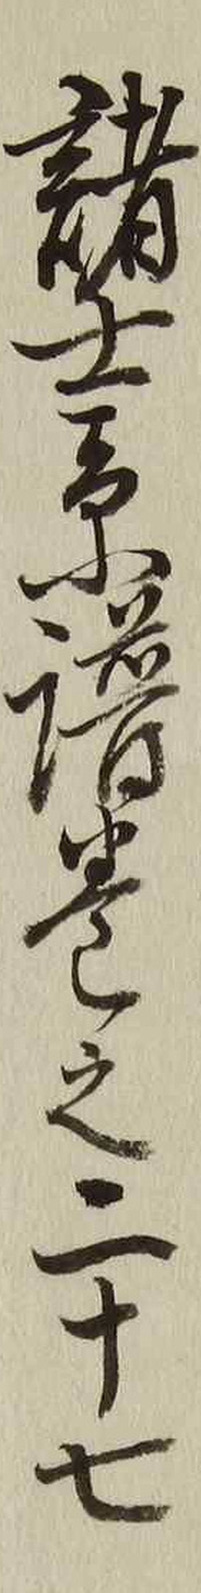諸士系譜巻之二十七
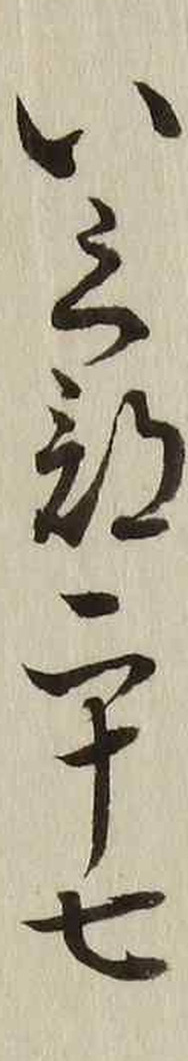い之部二十七
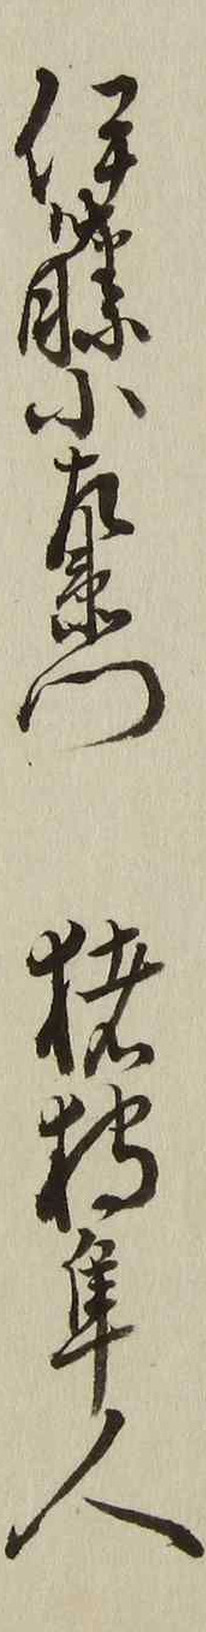伊藤小左衛門猪狩隼人
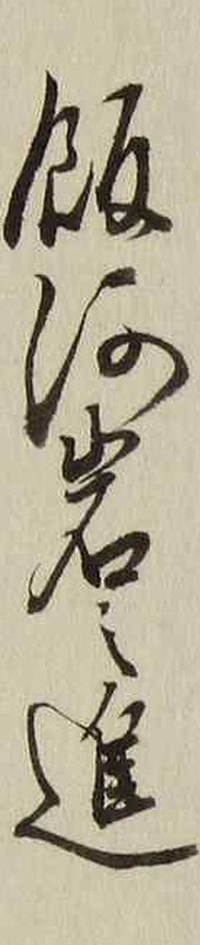飯河岩之進

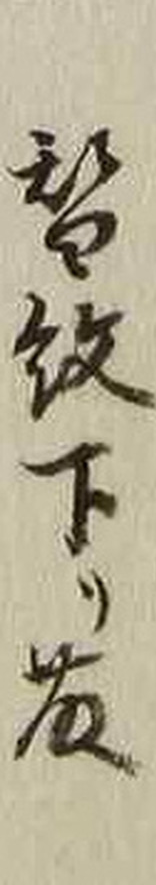替紋下り藤
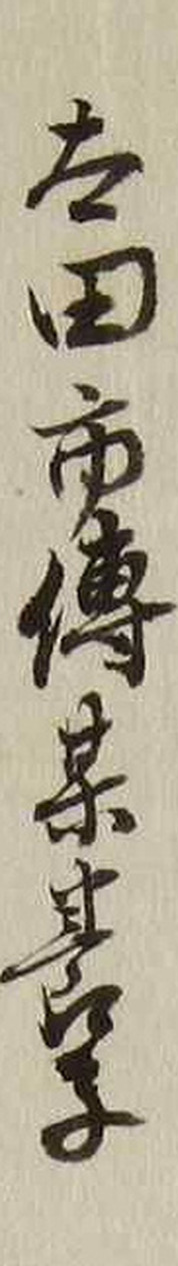太田市伝某養子
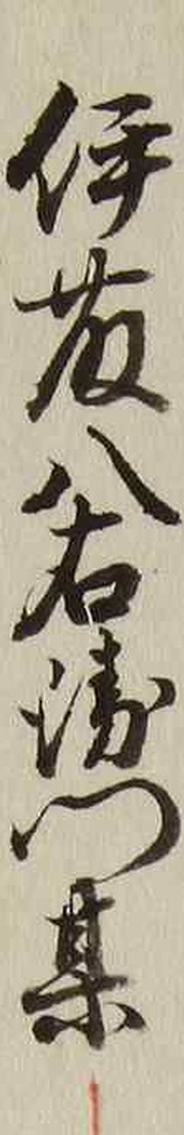伊藤八右衛門某
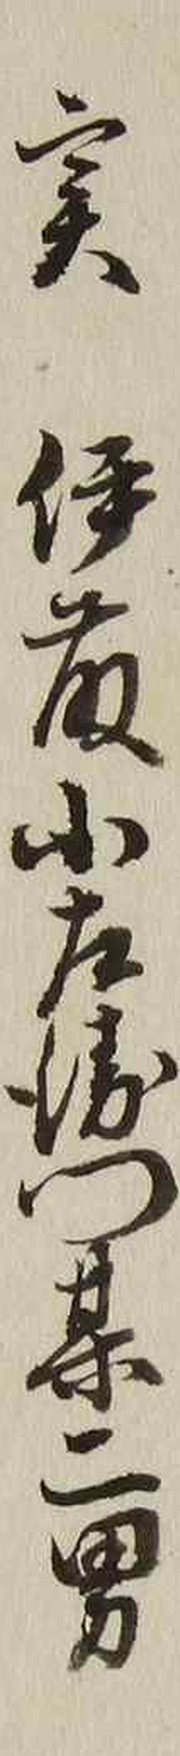実伊藤小左衛門某二男
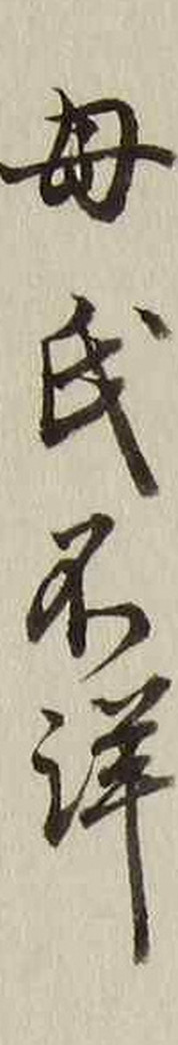母氏不詳
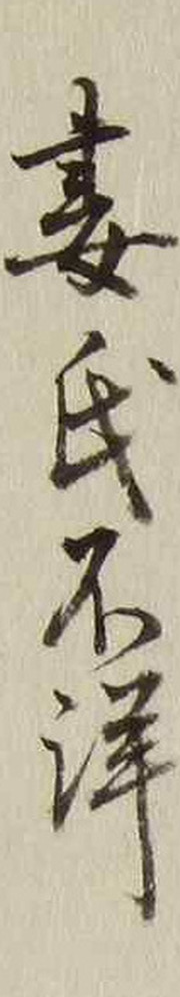妻氏不詳
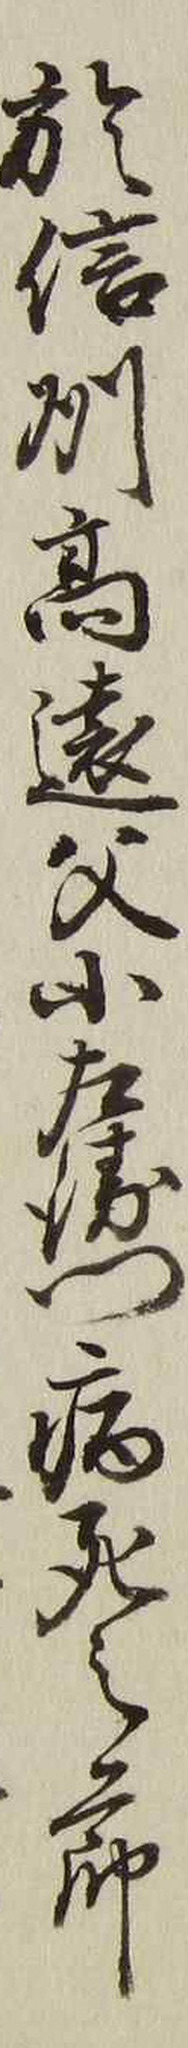於信州高遠父小左衛門病死之節
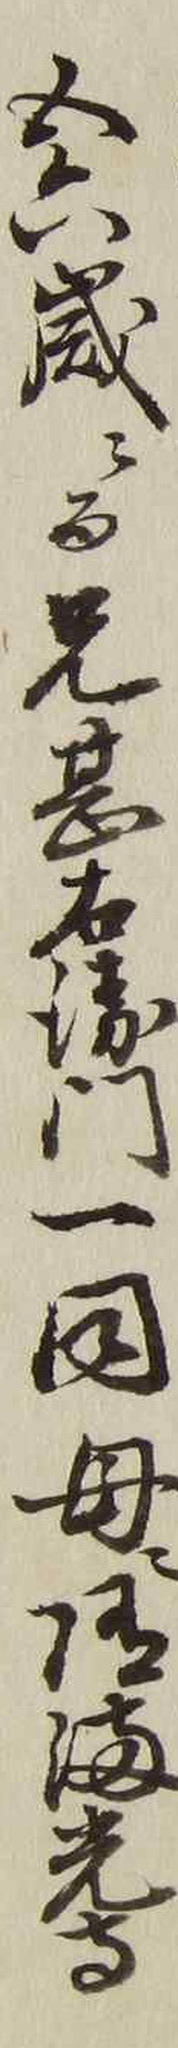五六歳ニ而兄甚右衛門一同母ニ随満光寺

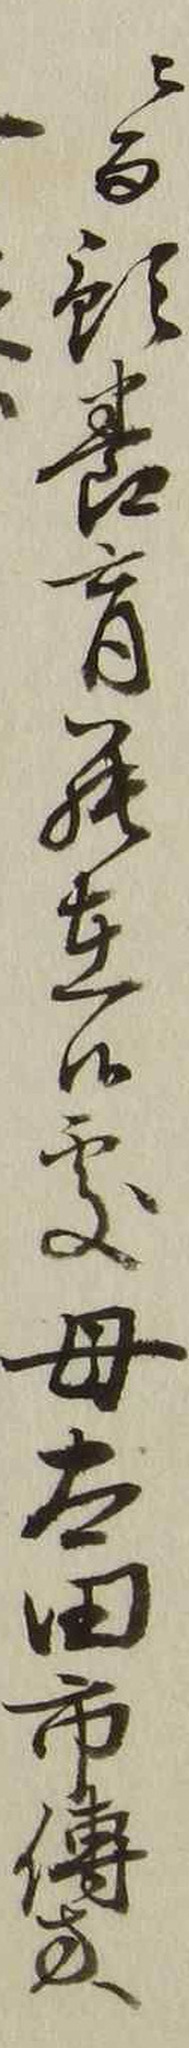ニ而預養盲罷在候処母太田市伝方へ
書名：諸士系譜　巻之27　い之部27
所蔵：会津若松市立会津図書館
